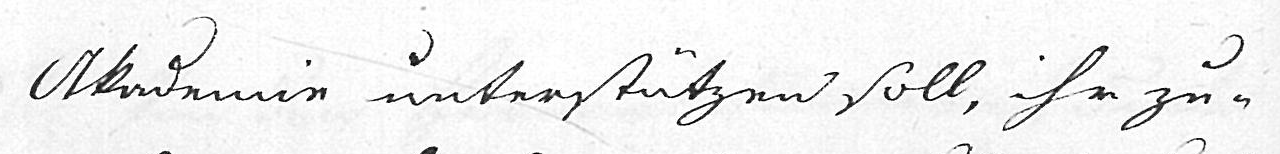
Akademie unterstätzen soll, ihr zu-
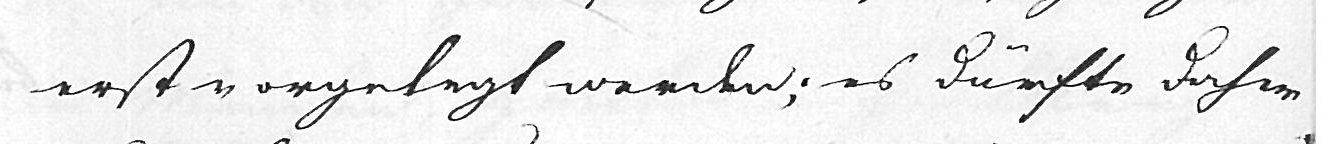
erst vorgelegt werden; es dürfte daher
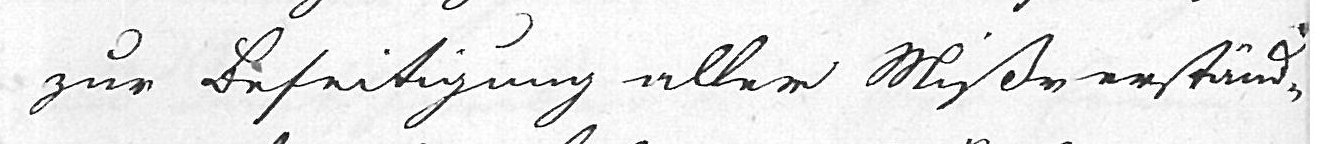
zur Beseitigung aller Mißverständ-
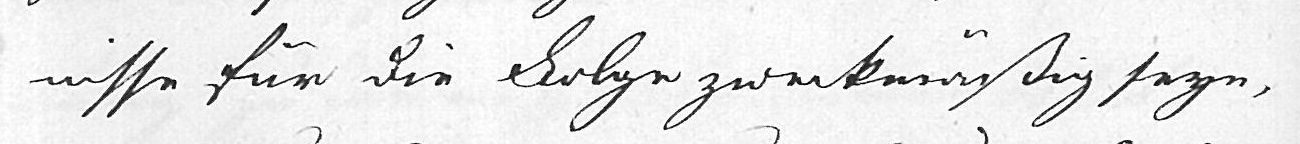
nisse für die Folge zweckmäßig seyn,
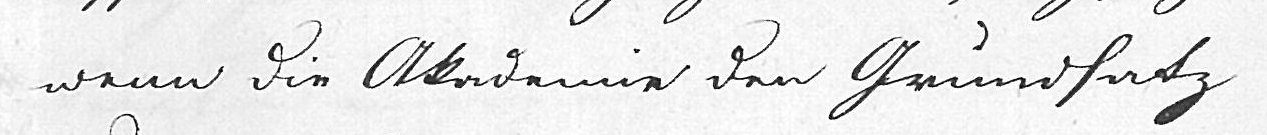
wenn die Akademie den Grundsatz
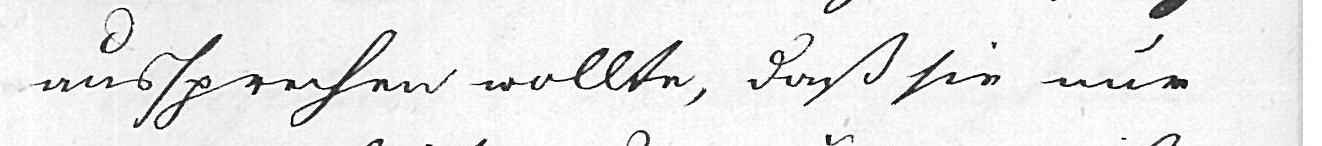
aussprechen wollte, daß sie nur
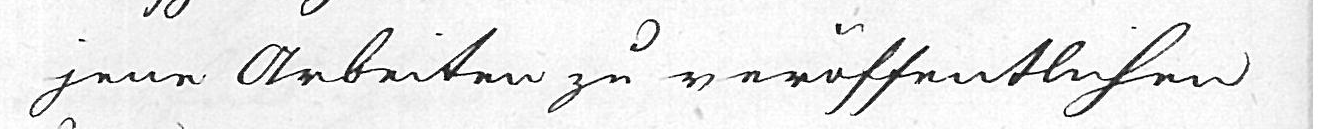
jene Arbeiten zu veröffentlichen
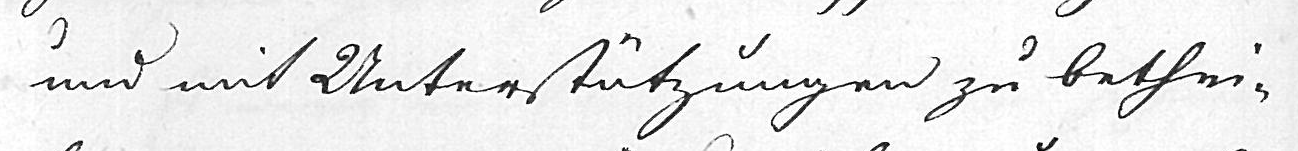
und mit Unterstützungen zu bethei-
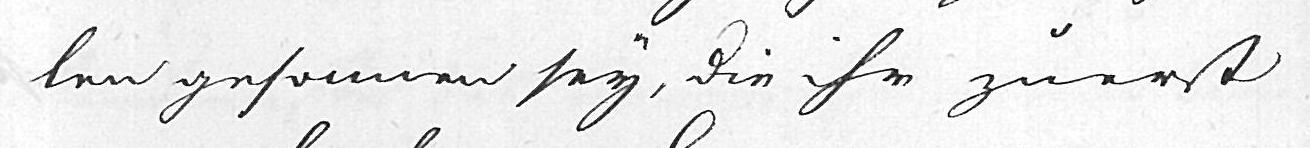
len gesonnen sey, die ihre zuerst
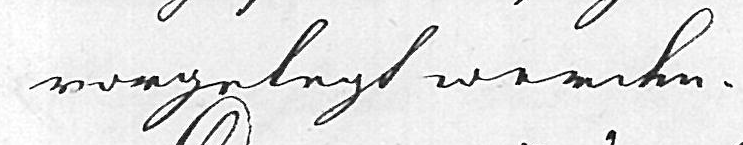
vorgelegt werden.
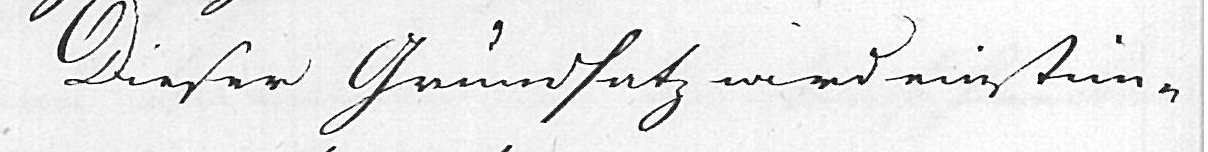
Dieser Grundsatz wird einstim-
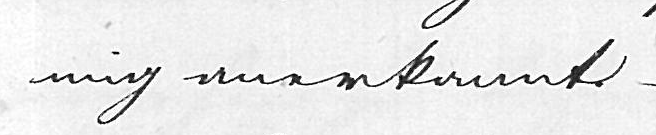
mig anerkannt.
